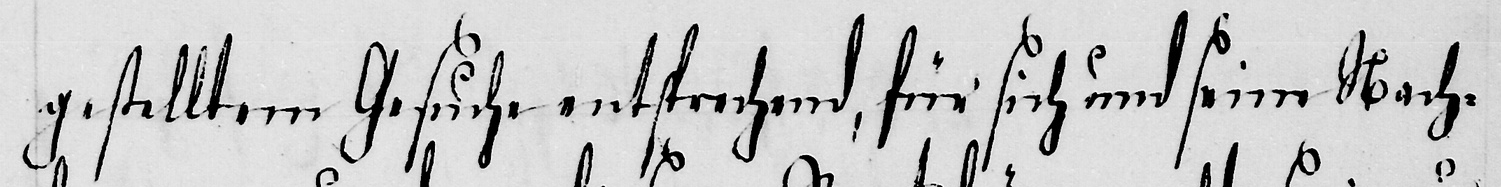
gestelltem Gesuche entsprechend, für sich und seine Nach¬
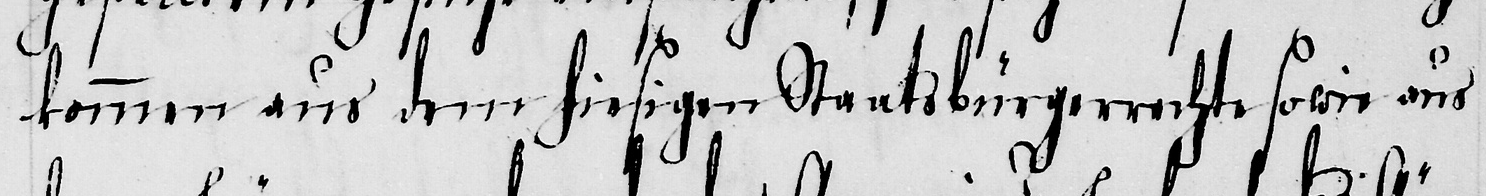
kommen aus dem hiesigen Staatsbürgerrechte sowie aus
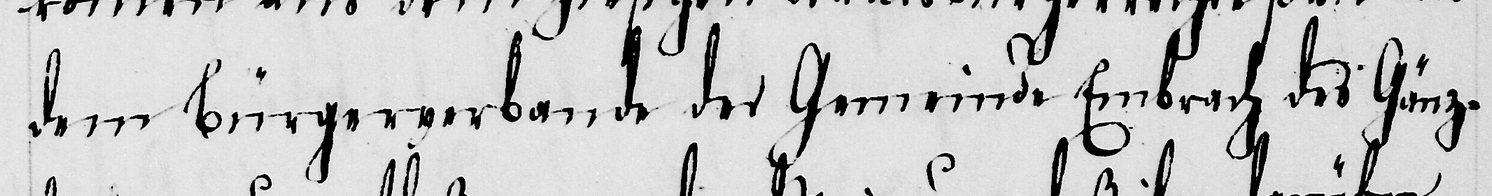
dem Bürgerverbande der Gemeinde Embrach des Gänz¬
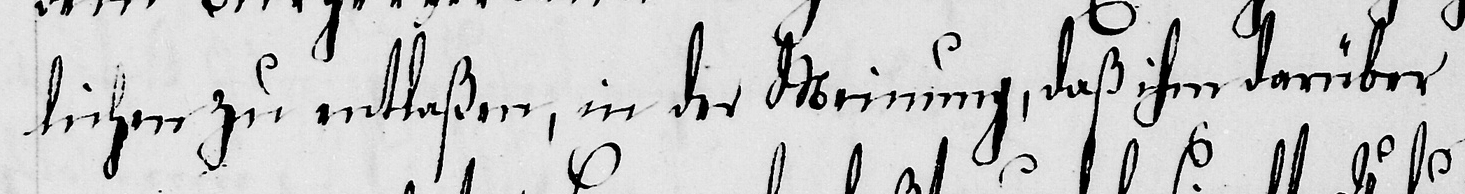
lichen zu entlaßen, in der Meinung, daß ihm darüber
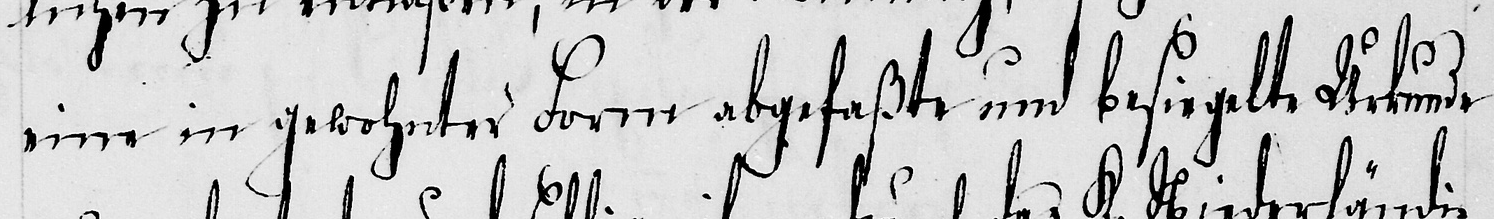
eine in gewohnter Form abgefaßte und besiegelte Urkunde
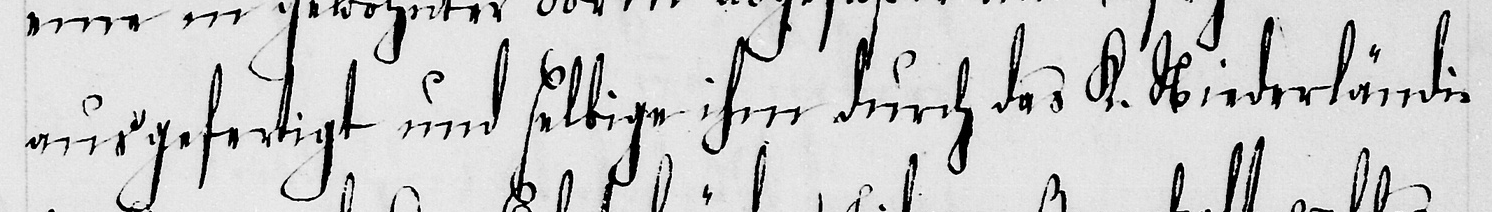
ausgefertigt und selbige ihm durch das K. Niederländi¬
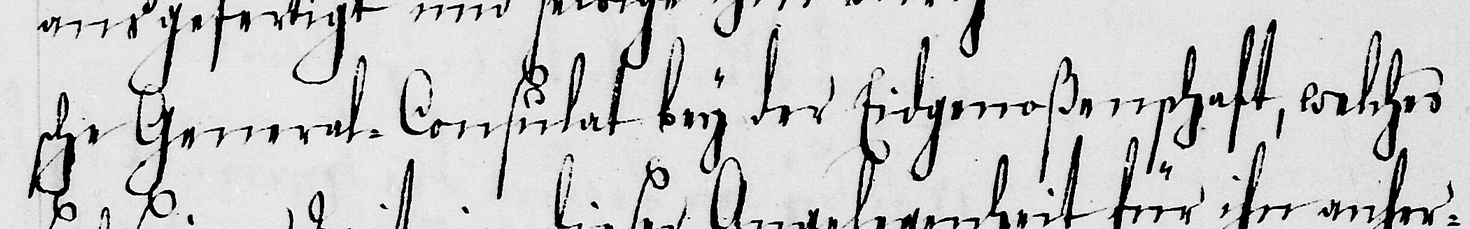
sche General-Consulat bey der Eidgenoßenschaft, welch¬
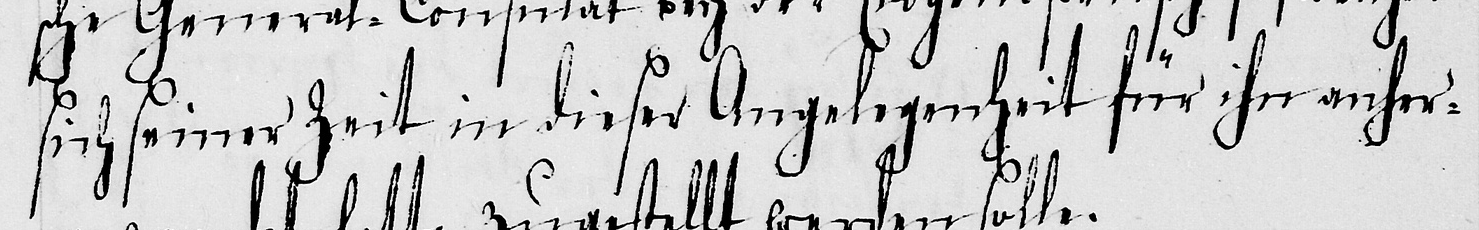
sich seiner Zeit in dieser Angelegenheit für ihn anher¬
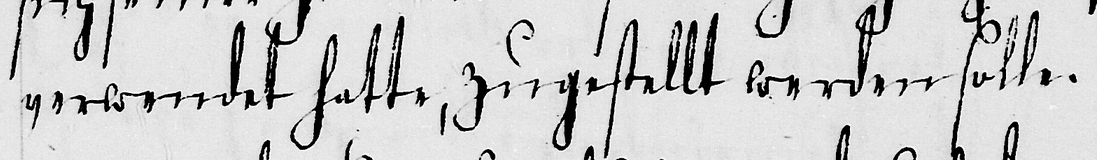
verwendet hatte, zugestellt werden solle.
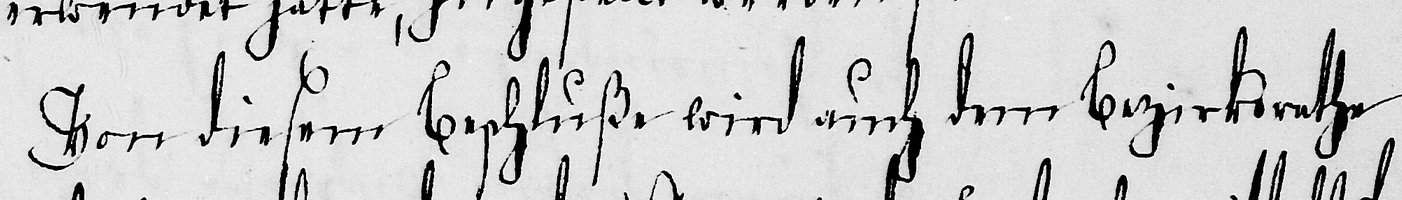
Von diesem Beschluße wird auch dem Bezirksrathe
